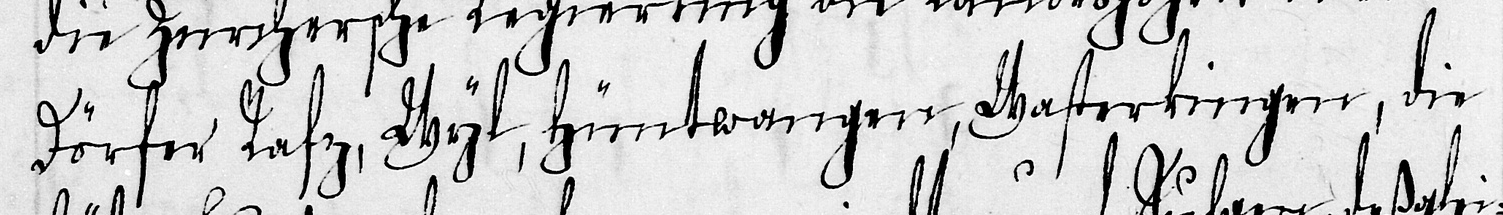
Dörfer Rafz, Wyl, Hüntwangen, Wasterkingen, die
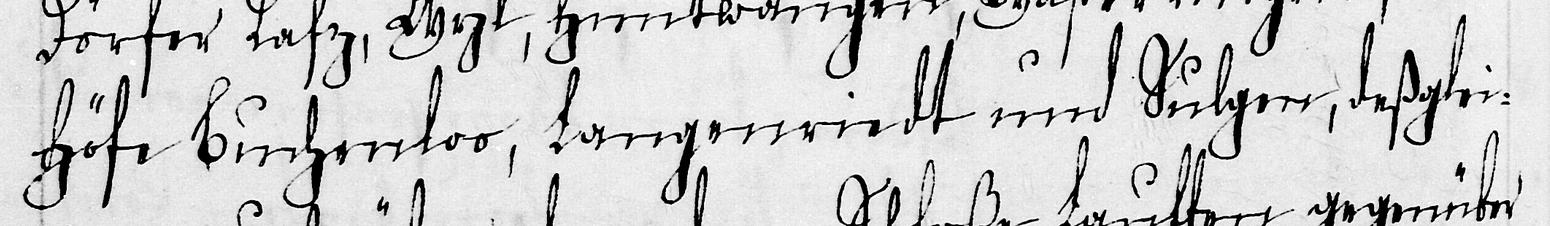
Höfe Buchenloo, Langenriedt und Sulgen, deßglei¬
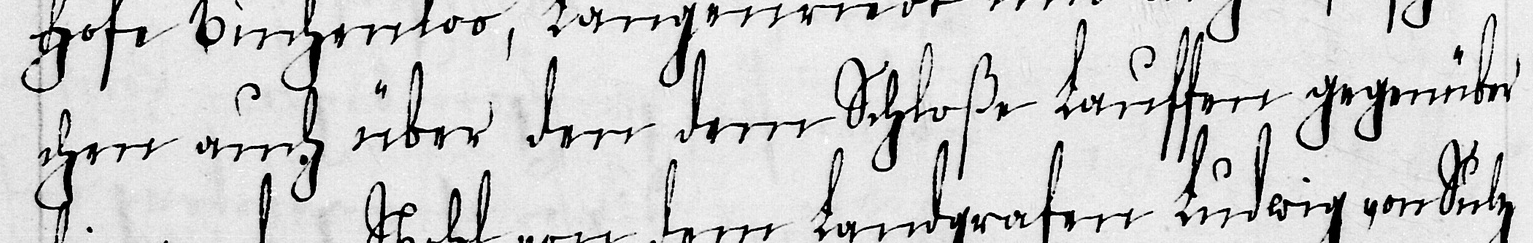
chen auch über den dem Schloße Lauffen gegenüber
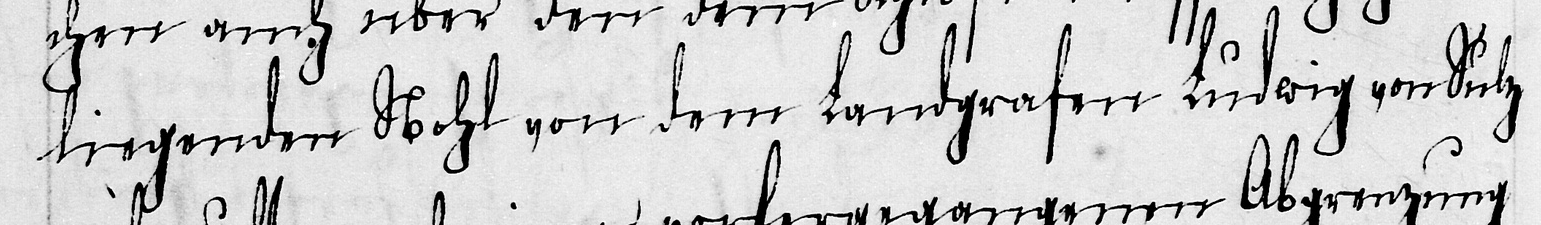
liegenden Nohl von dem Landgrafen Ludwig von Sulz
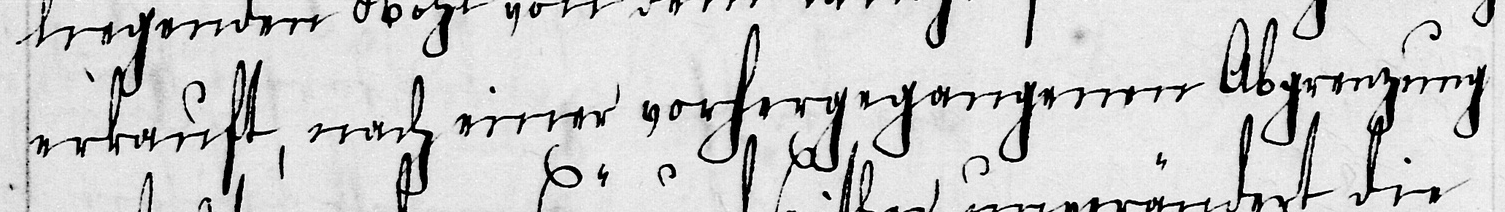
erkauft, nach einer vorhergegangenen Abgrenzung
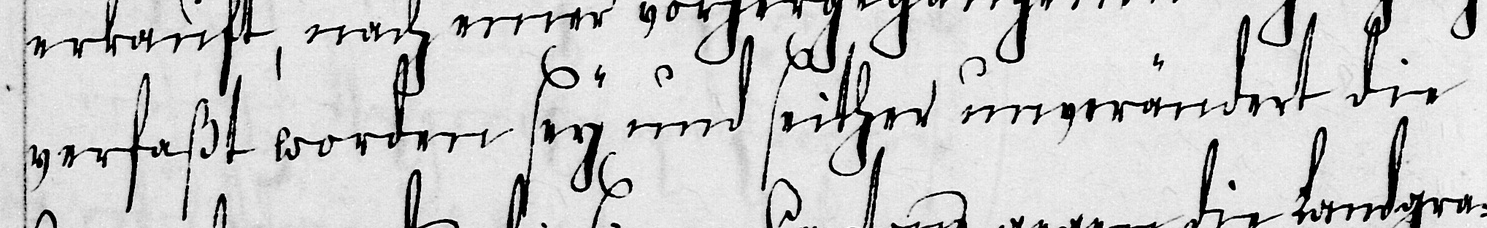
verfaßt worden sey und seither unverändert die
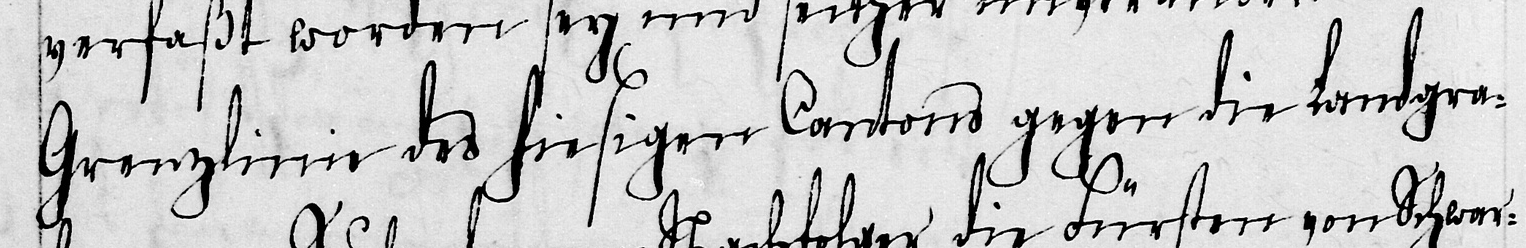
Grenzlinie des hiesigen Cantons gegen die Landgra¬
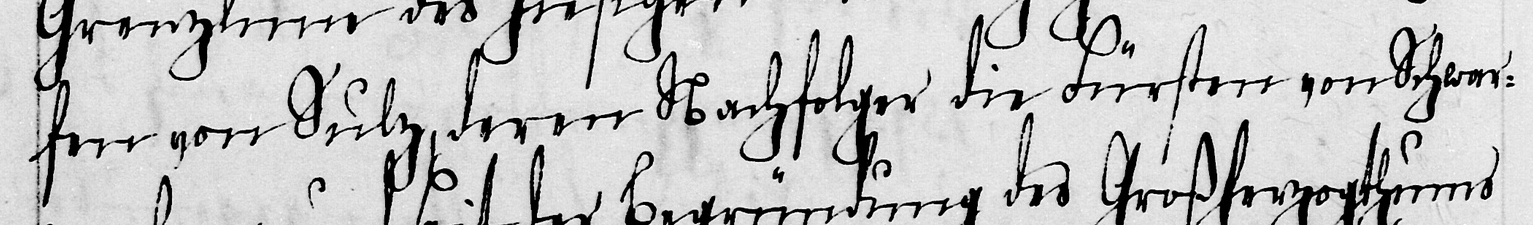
fen von Sulz, deren Nachfolger die Fürsten von Schwar¬
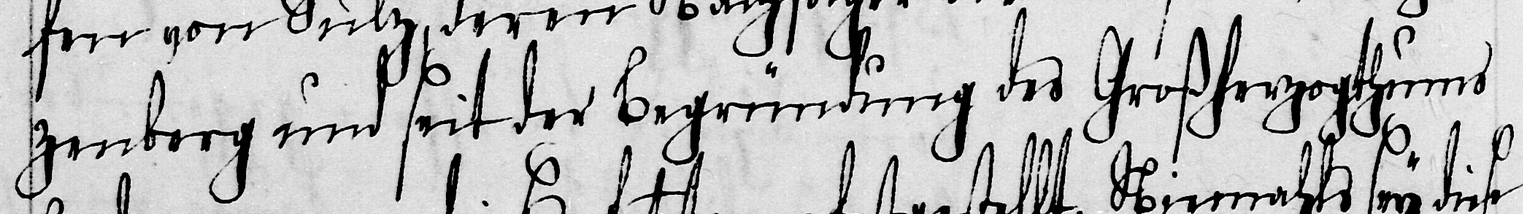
zenberg und seit der Begründung des Großherzogthums
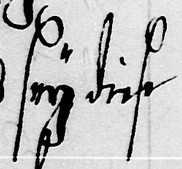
diese
